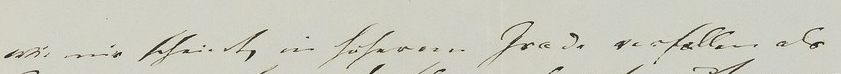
wie mir scheint, in höherem Grade verfallen als
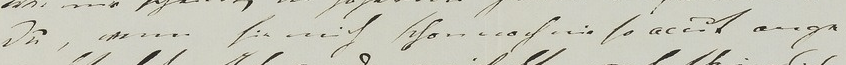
Du, wenn sie mich schon noch nie so acut ange-
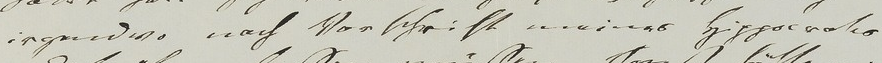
irgendwo nach Vorschrift meines Hippocrates
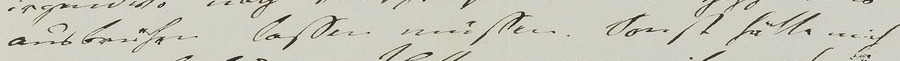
ausbrühen lassen müssen. Sonst hätte mich
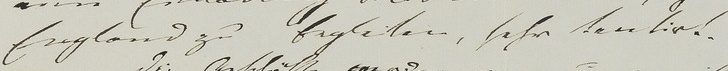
England zu begleiten, sehr tentirt.
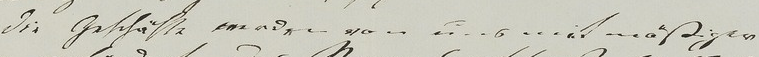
Die Geschäfte werden von uns mit mäßiger
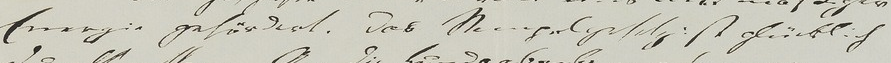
Energie gefördert. Das Stempelgesetz ist glücklich
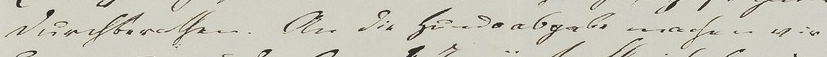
durchberathen. An die Hundeabgabe machen wir
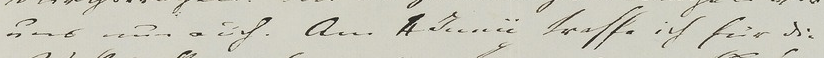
uns nun auch. Am 4 Junii treffe ich für die
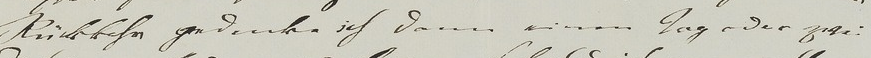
Rückkehr gedenke ich dann einen Tag oder zwei
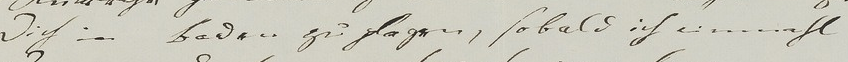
Dich in Baden zu plagen, sobald ich einmahl
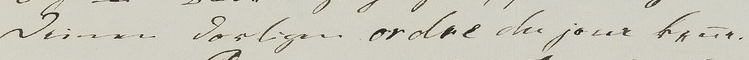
Deinen dortigen ordre du jour kenne.
